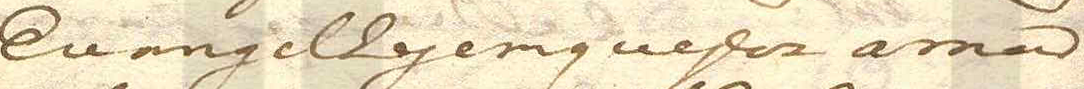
Euangelhos em que poz a maõ
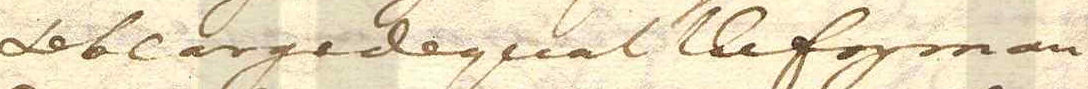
sob cargo do qual lhe foy man
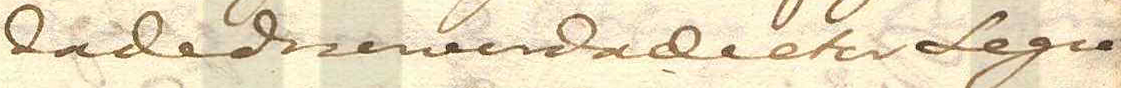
dado dizer verdade e ter segre
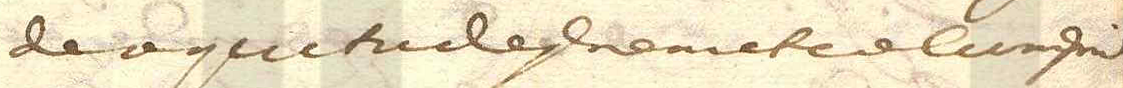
do o que tudo prometeo cumprir
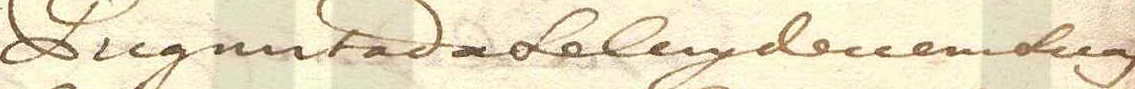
Perguntada se cuydou em suas
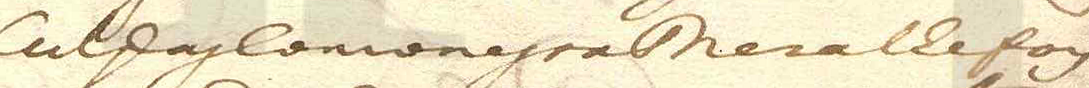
culpas como nesta Meza lhe foy
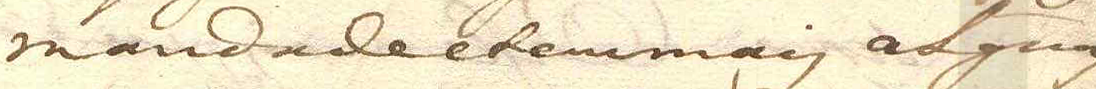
mandado e tem mais alguas
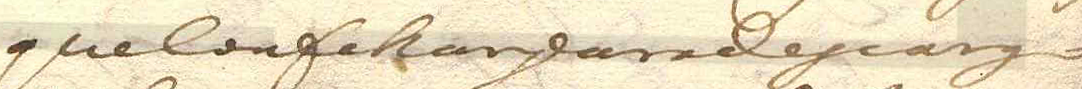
que confessar para descargo
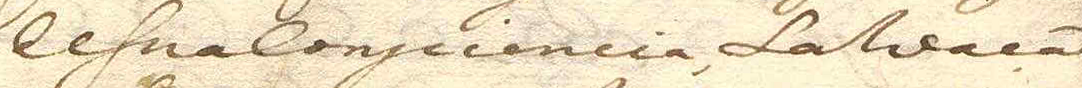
de sua consciencia, salvaçaõ
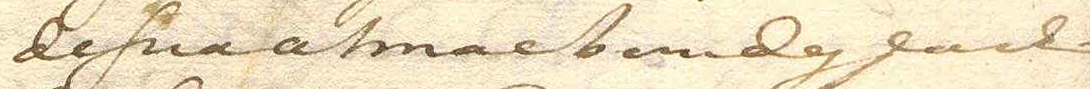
de sua alma e bom despacho
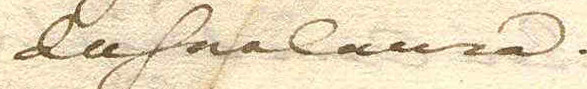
da sua cauza.
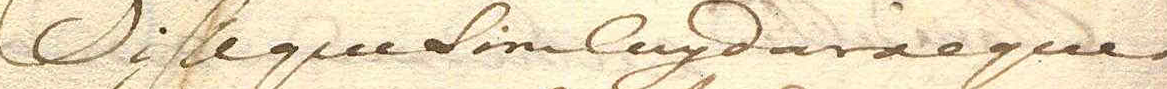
Disse que sim cuydara e que
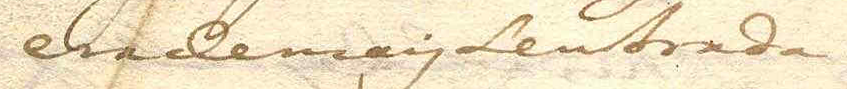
era de mais lembrada
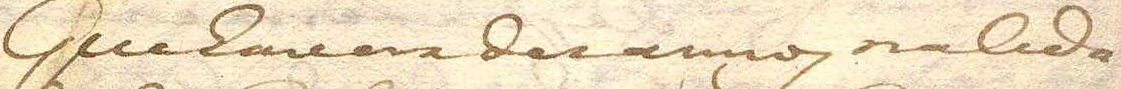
Que hauera dez annos na cida
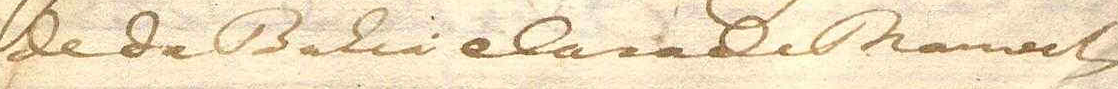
de da Bahia e caza de Manoel
